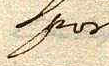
por
